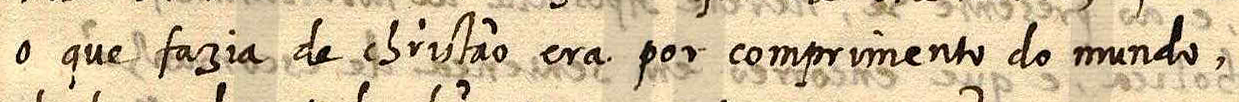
o que fazia de christão era por comprimento do mundo,
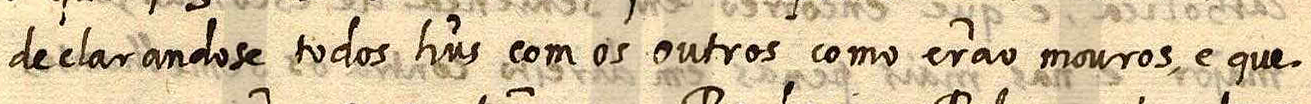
declarandose todos hūs com os outros como erão mouros, e que
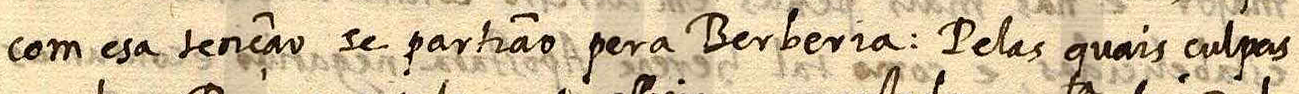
com esa tenção se partião pera Berberia: Pelas quais culpas
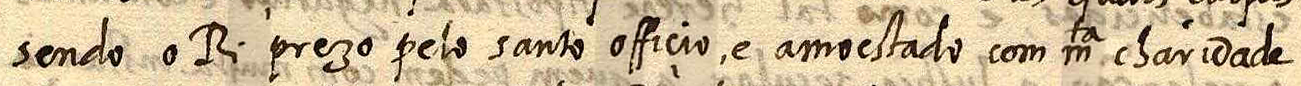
sendo o R. prezo pelo santo officio, e amoestado com mta charidade
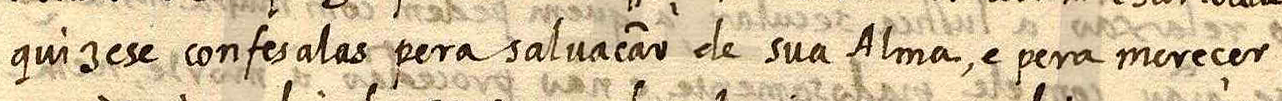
quizese confesalas pera saluacão de sua Alma, e pera mereçer
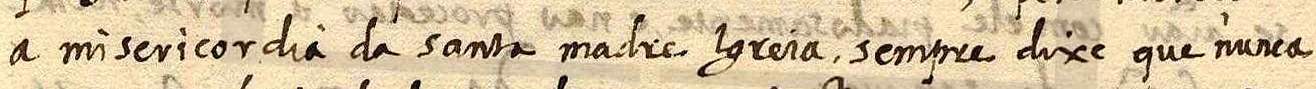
a misericordia da santa madre Igreia, sempre dixe que nunca
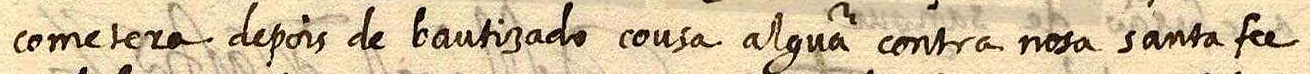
cometera depois de bautizado cousa alguā contra nosa santa fee
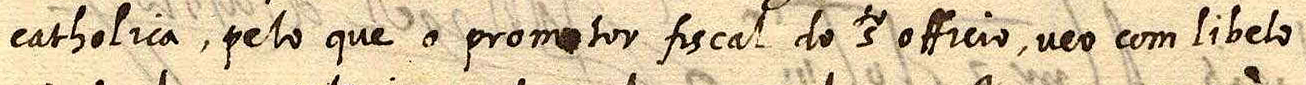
catholica, pelo que o promotor fiscal do sto officio, ueo com libelo
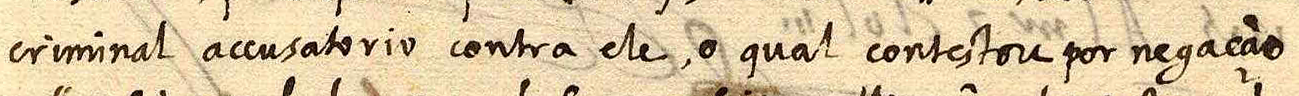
criminal accusatorio contra ele, o qual contestou por negação
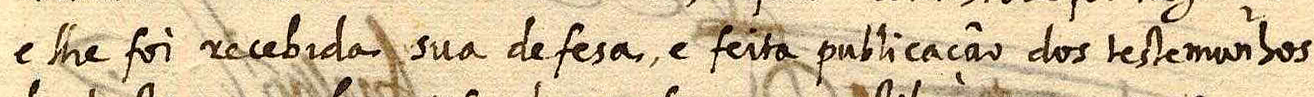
e lhe foi recebida sua defesa, e feita publicação dos testemunhos
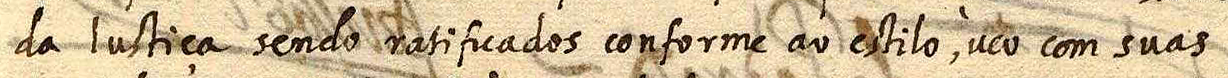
da Iustiça sendo ratificados conforme ao estilo, ueo com suas
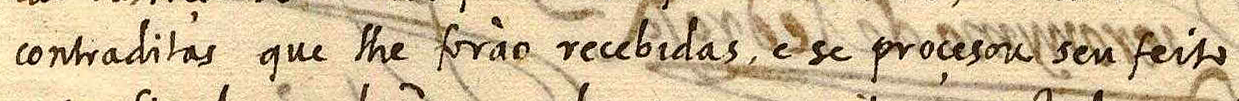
contraditas que lhe forão recebidas, e se proçesou seu feito
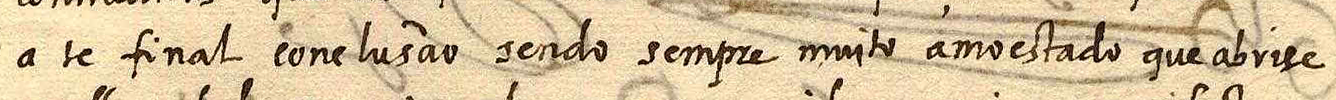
ate final conclusão sendo sempre muito amoestado que abrise
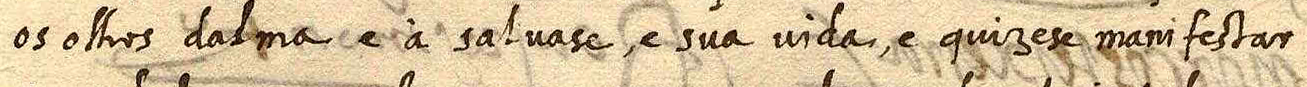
os olhos dalma e a saluase, e sua uida, e quizese manifestar
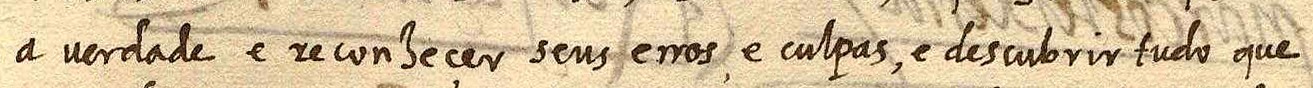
a uerdade e reconheçer seus erros, e culpas, e descubrir tudo que
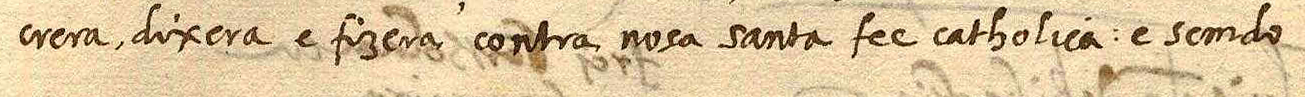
crera, dixera e fizera contra nosa santa fee catholica: e semdo
